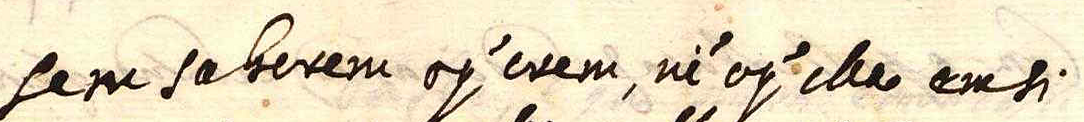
sem saberem o q̄ crem nē o q̄ ella em si
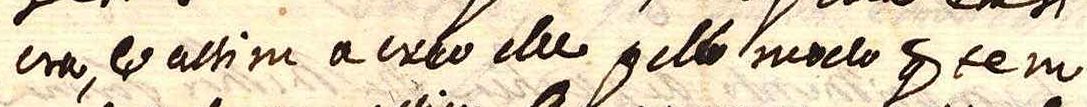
era, & assim o creo elle pello modo q̄ tem
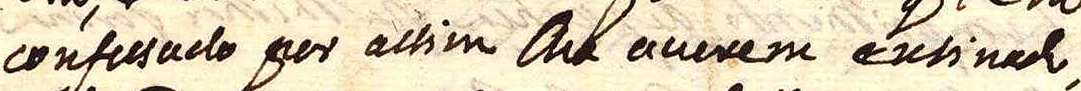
confessado per assim lhe auerem ensinado,
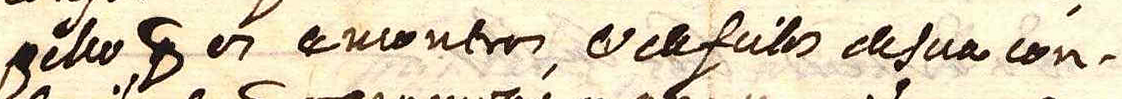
pello q̄ os encontros, & defeitos de sua con
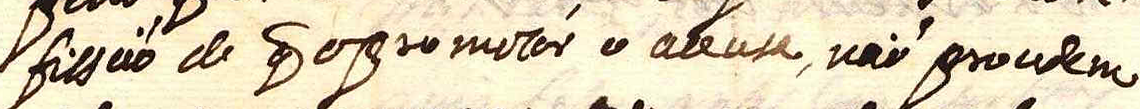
fissão de q̄ o promotor o accusa naõ procedem
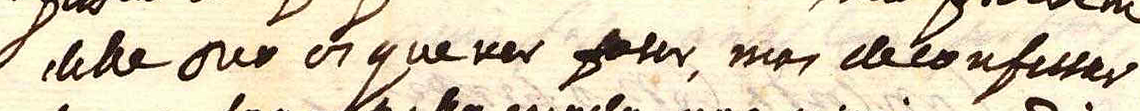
delle Reo os querer fazer, mas de confessar
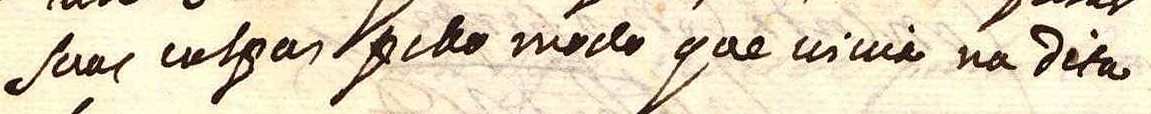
suas culpas pello modo que uiuia na dita
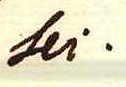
lei.
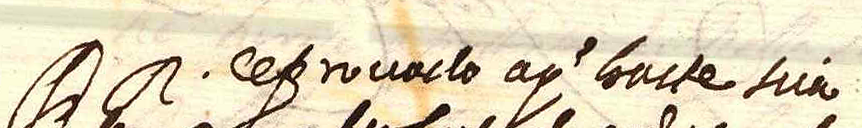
P R. & prouado o q̄ baste seia
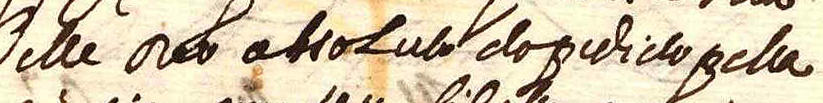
elle Reo absoluto do pedido pella
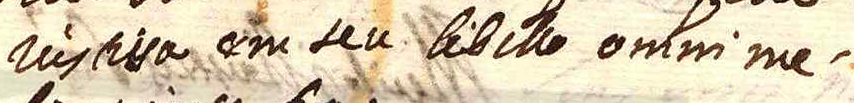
iustiça em seu libello omni me
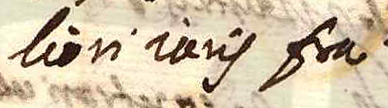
liori iuris fra.
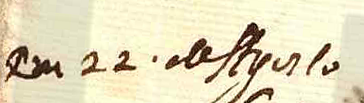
em 22. de Agosto
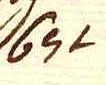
651
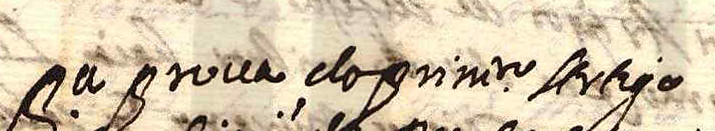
P.a proua do primro Artigo
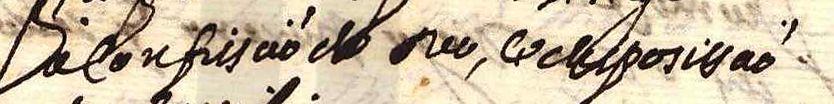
a confissaõ do Reo, & despozissaõ.
